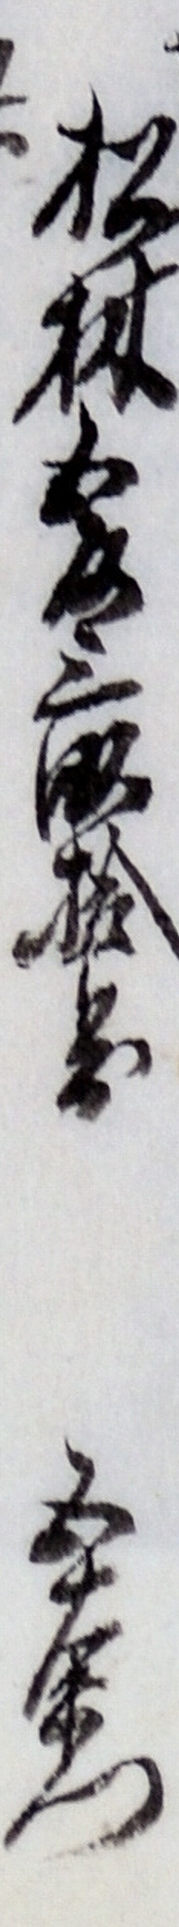松林五反三畝拾歩五右衛門
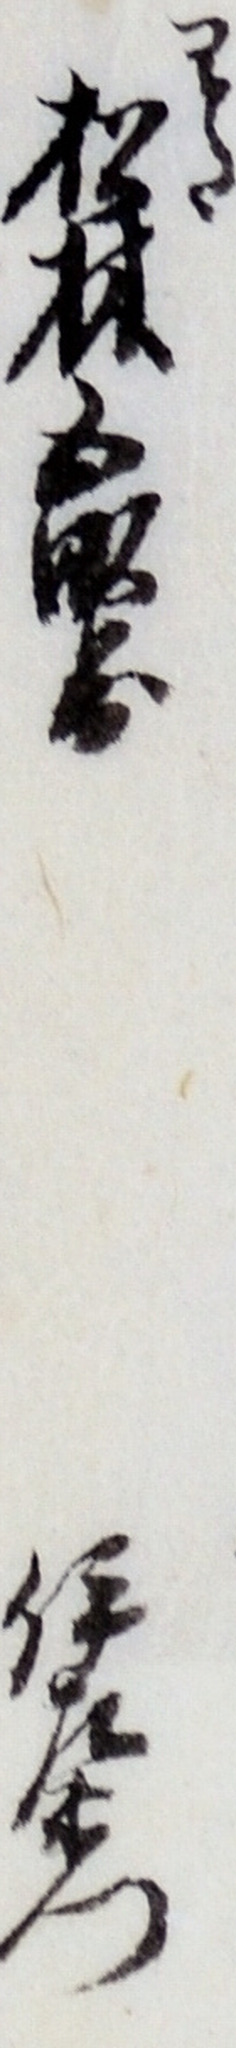松林五畝歩伊左衛門
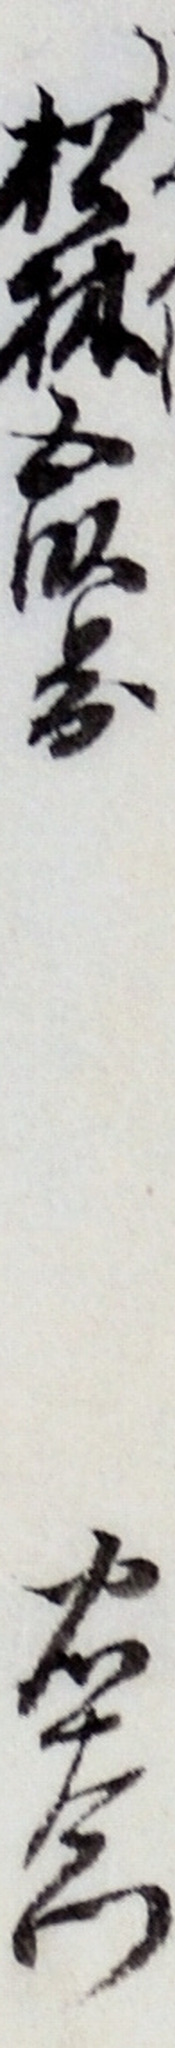松林五畝歩忠右衛門
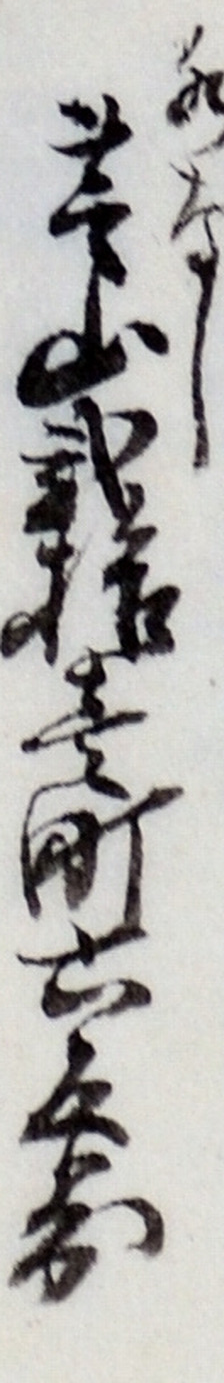芝山弐拾壱町六反歩村中

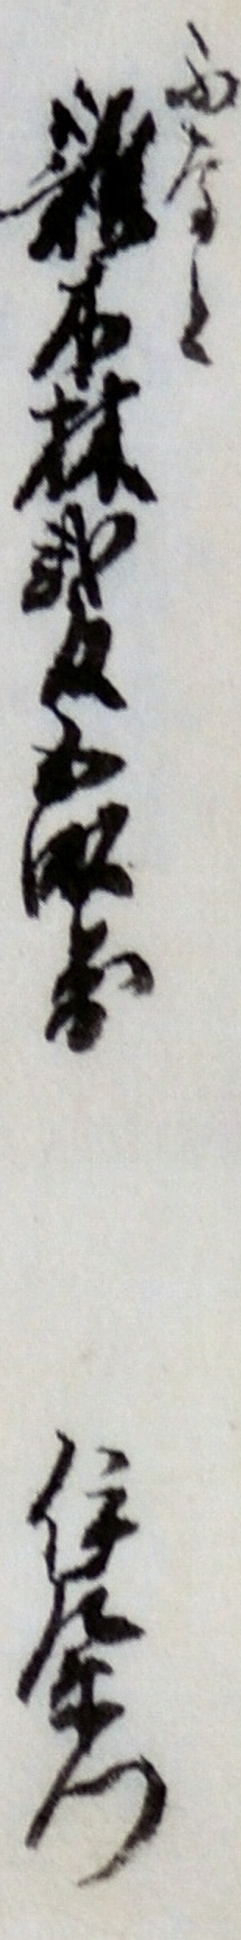雑木林弐反五畝歩伊左衛門
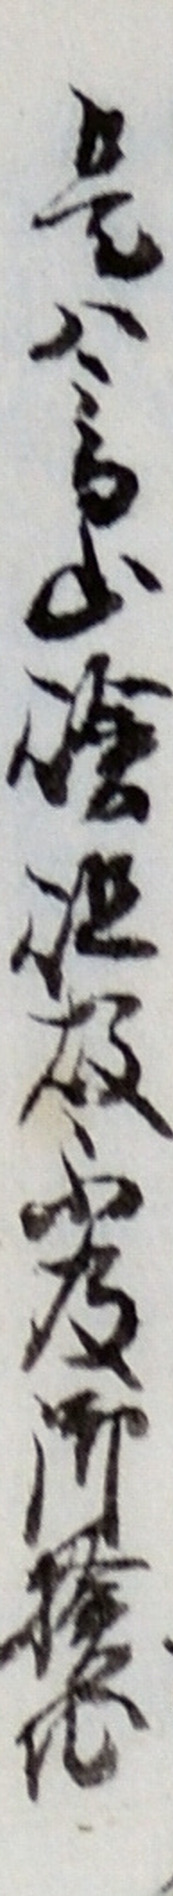是ハ高山嶮岨故不及御検地
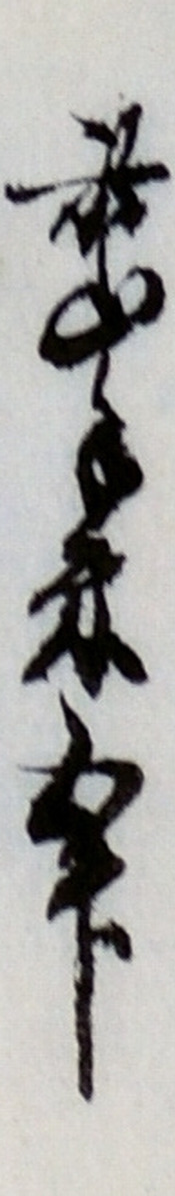此山手米五升
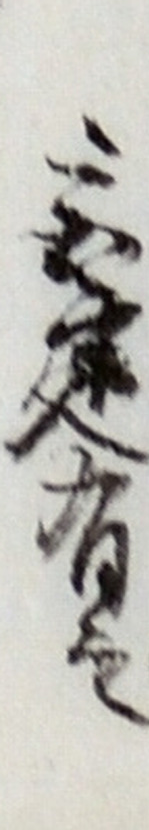宮建有之
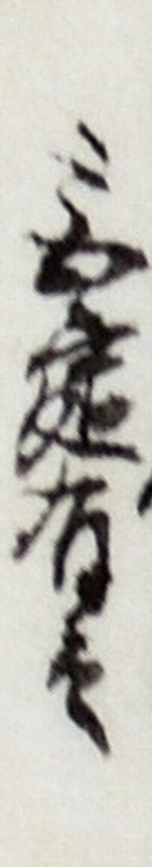宮建有之
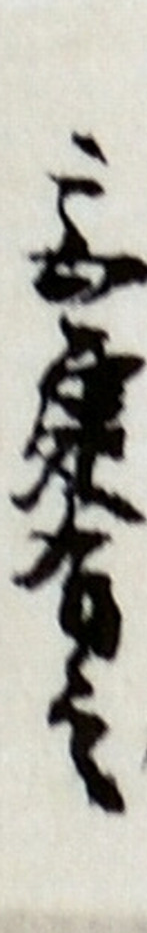宮建有之
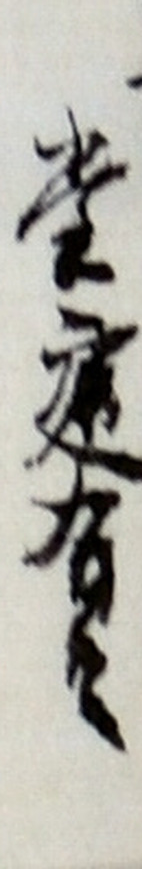堂建有之
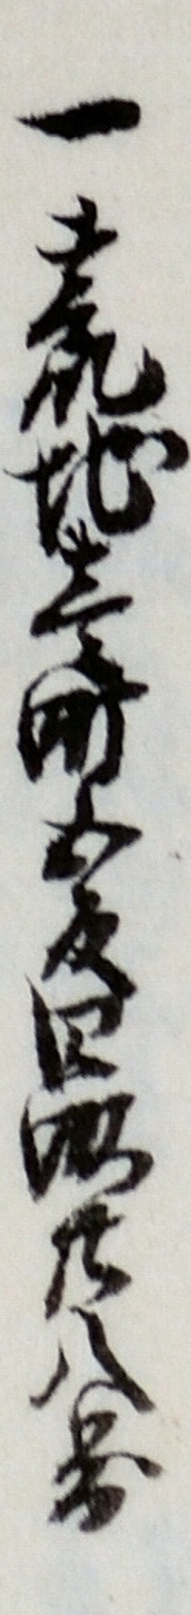一荒地壱町五反四畝廿八歩村中
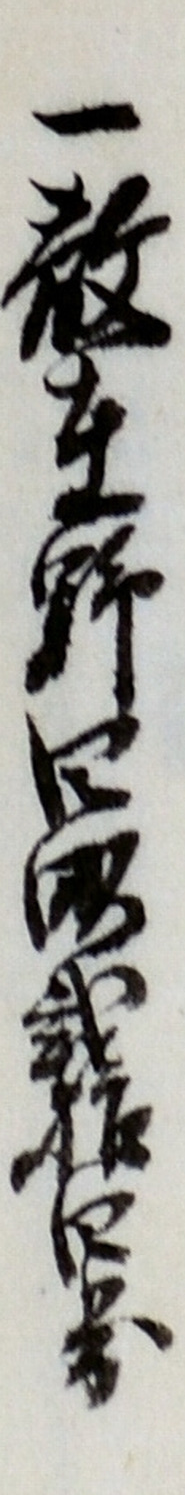一散在野四畝弐拾四歩

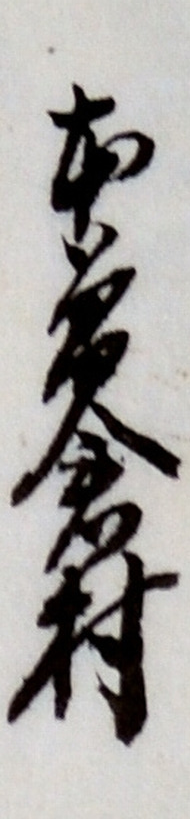本曾倉村
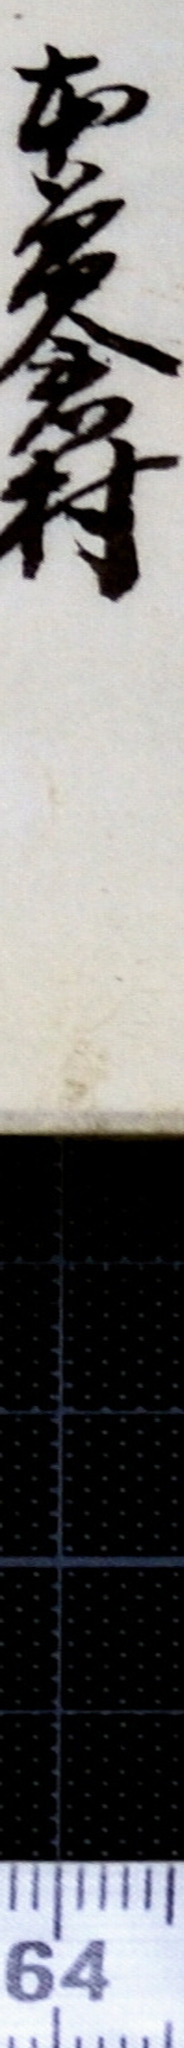本曾倉村
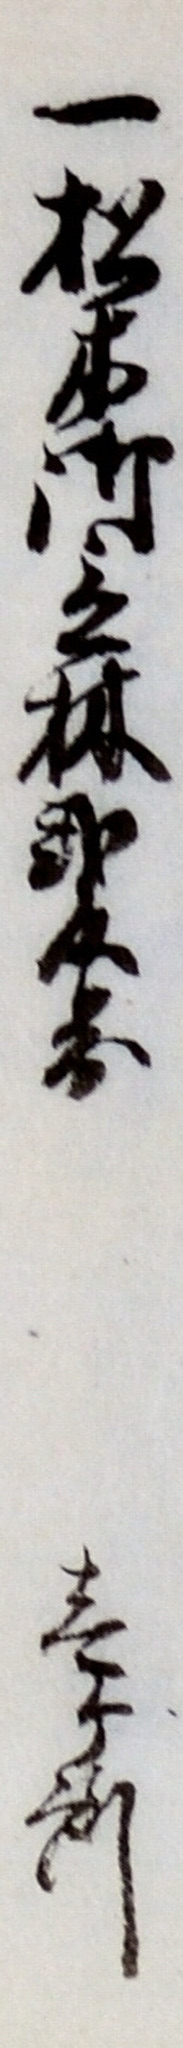一松木御立林弐反歩壱ヶ所
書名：御領分中山林社地手控
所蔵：伊那市立高遠町図書館・合同会社AMANE
